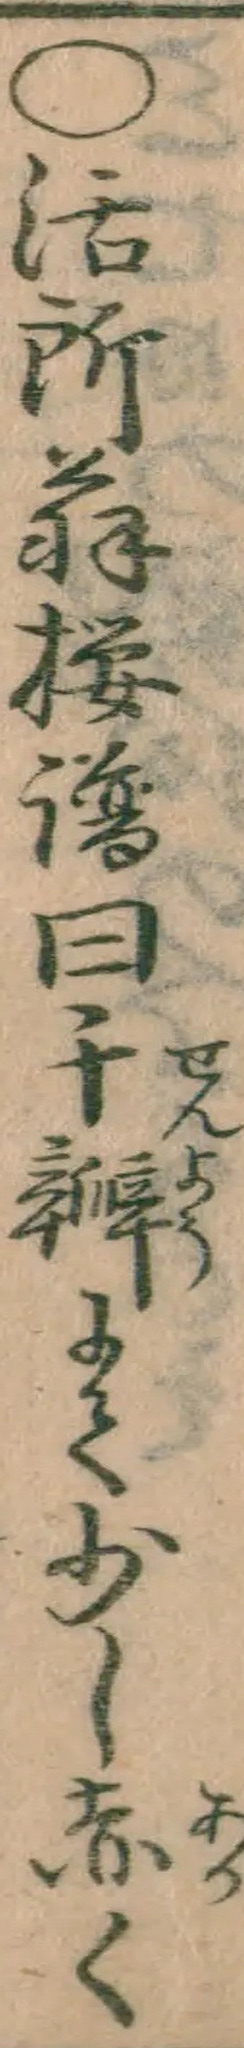○活所翁桜譜曰千弁にて少し赤く
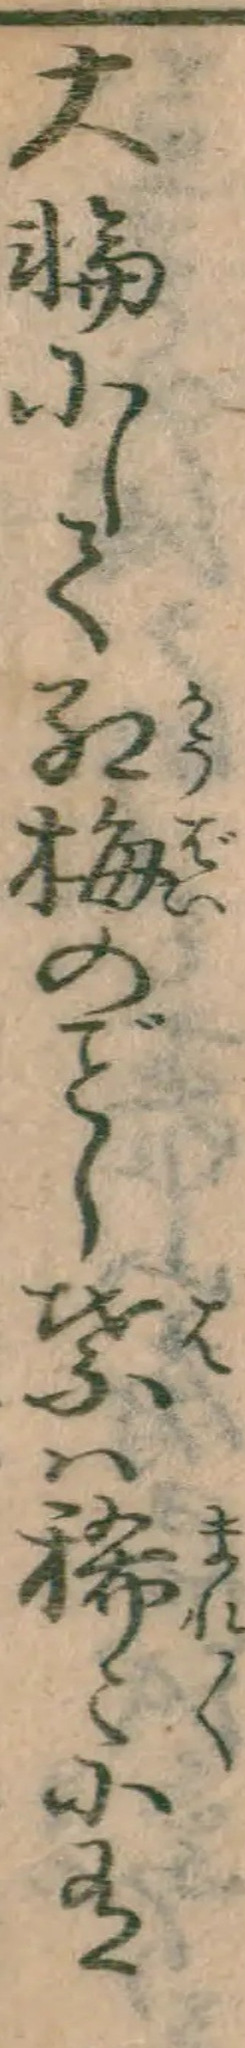大輪にして紅梅のごとし葉は稀々に有
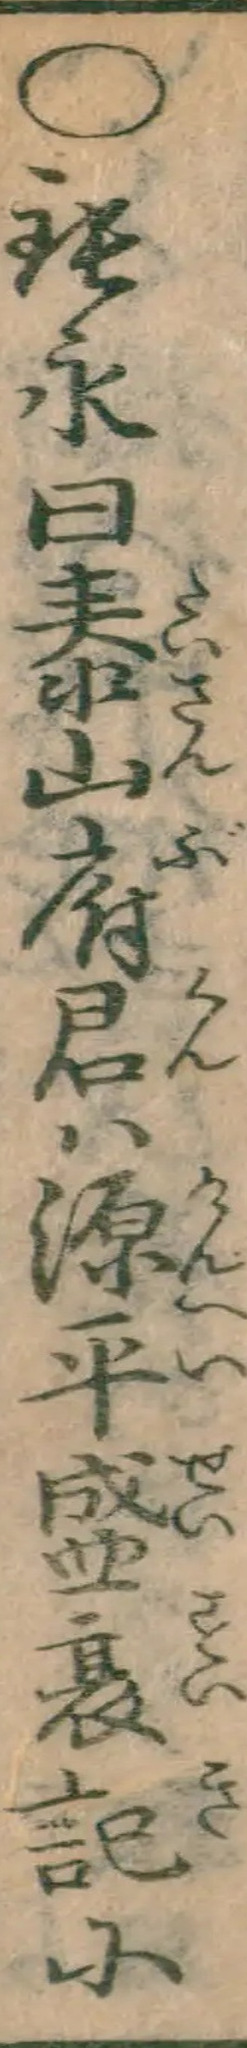○鈍永曰泰山府君は源平盛衰記に

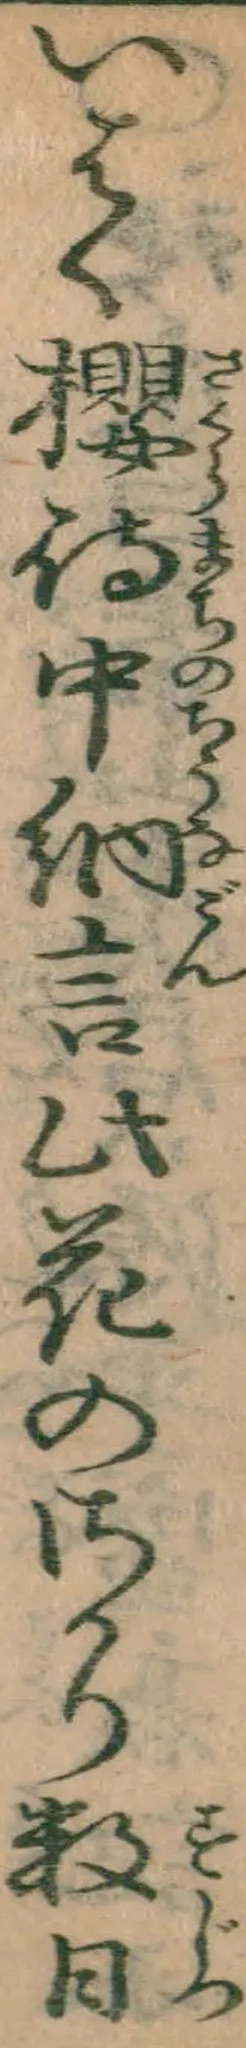いはく桜待中納言此花のさかり数日
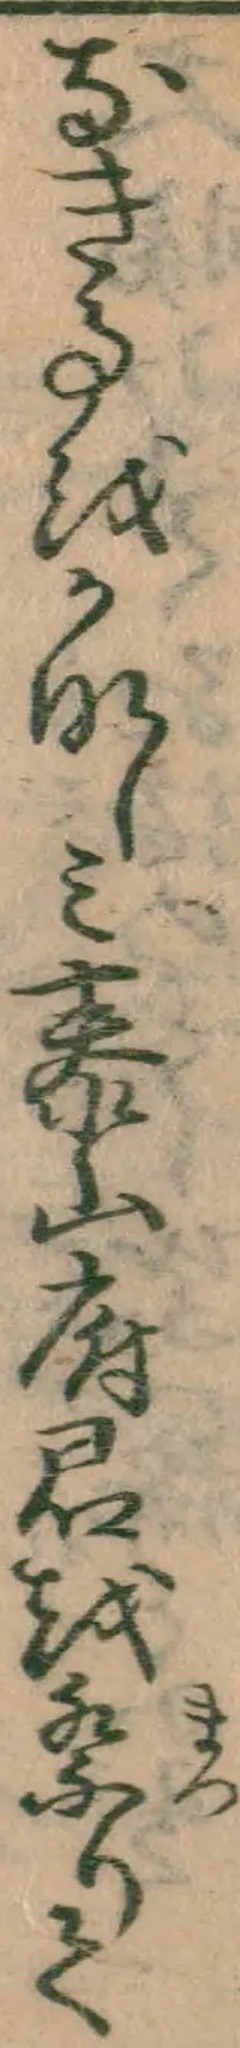なき事をかなしみ泰山府君を祭りて
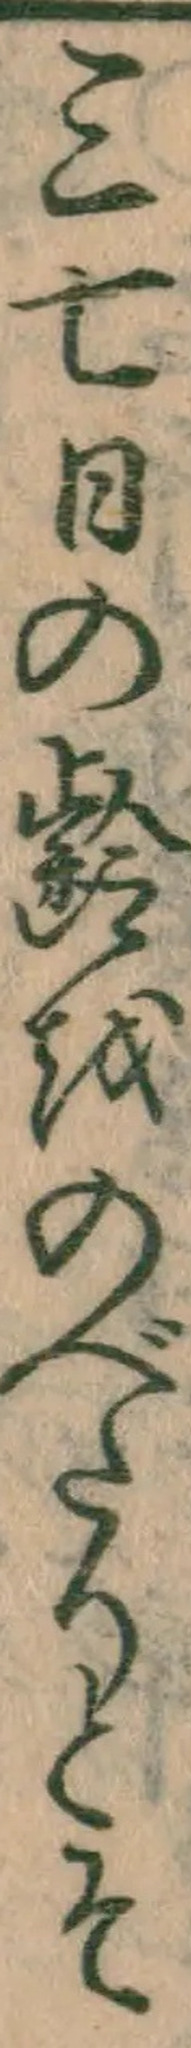三七日の齢をのべたりとそ
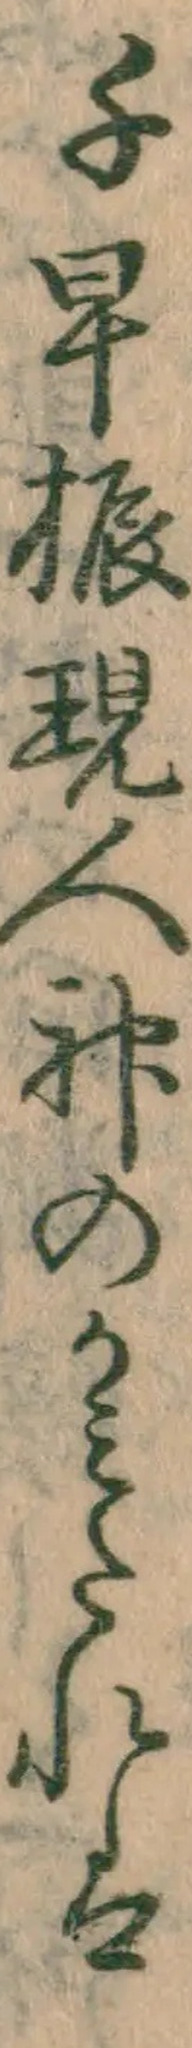千早振現人神のかみたれは
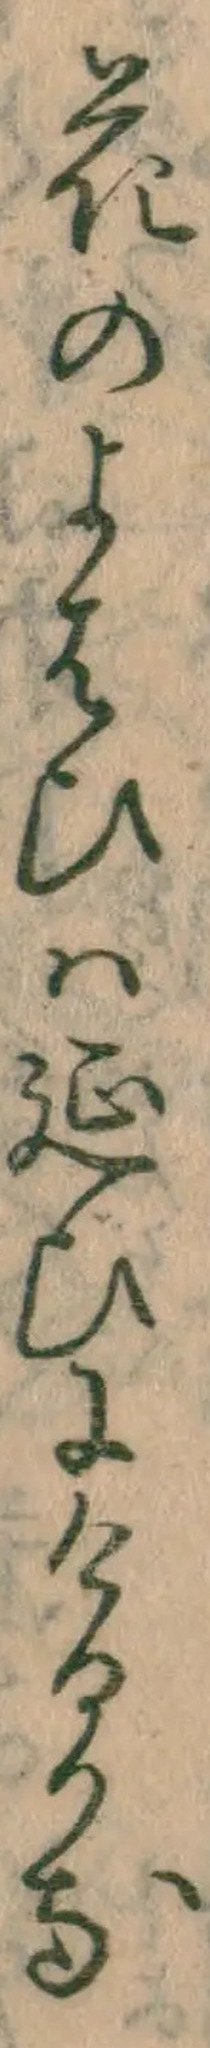花のよはひは延ひにけるかな
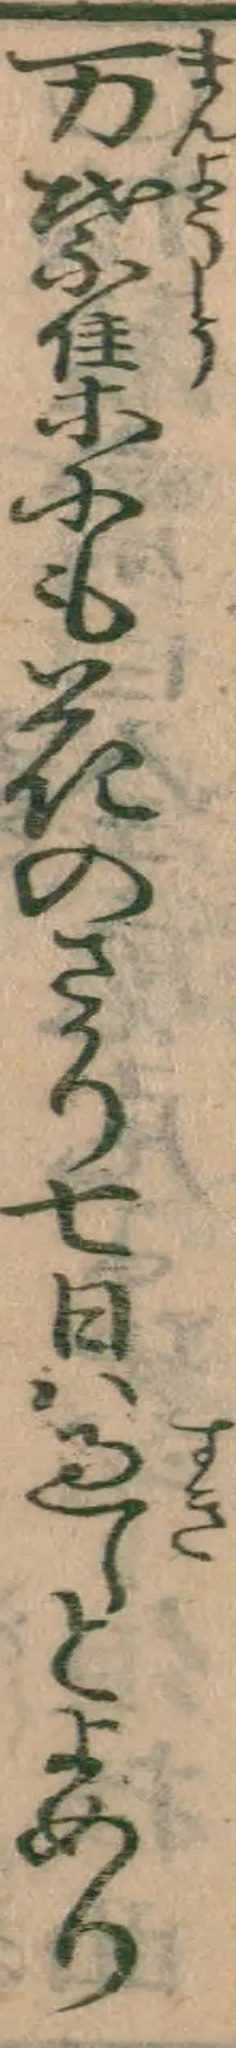万葉集にも花のさかり七日は過しとよめり
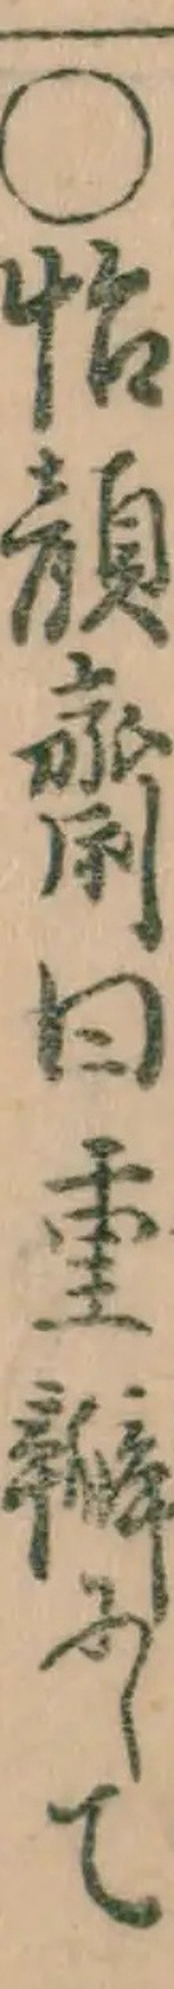○怡顔斎曰重弁にして
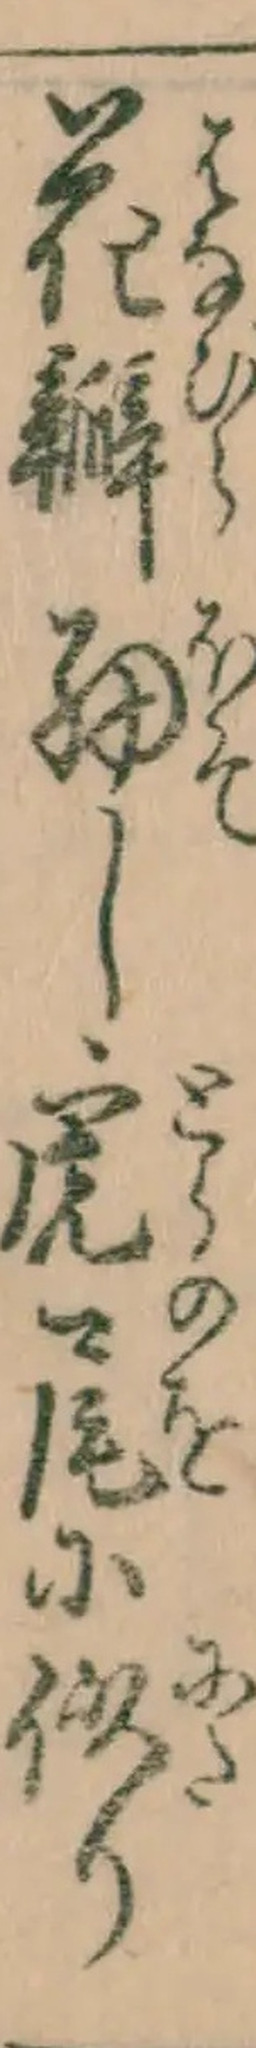花弁細し虎尾に似り
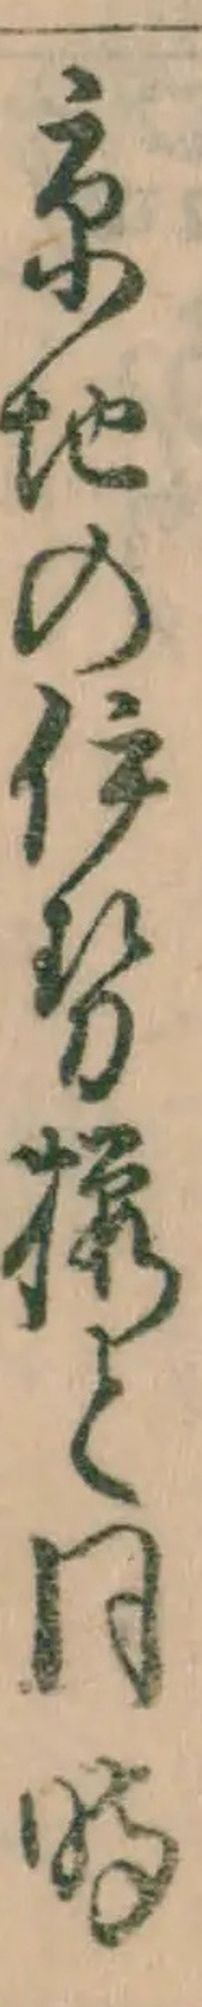京地の伊勢桜と同時
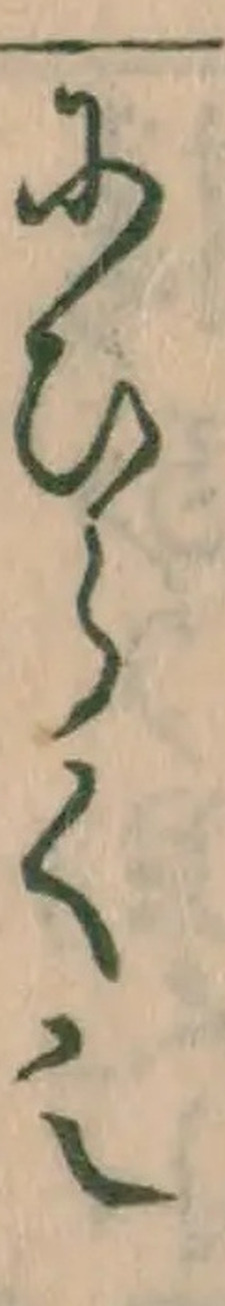にひらく也

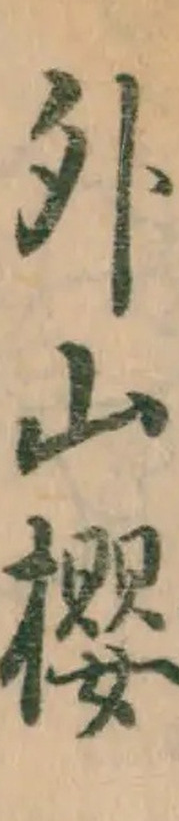外山桜
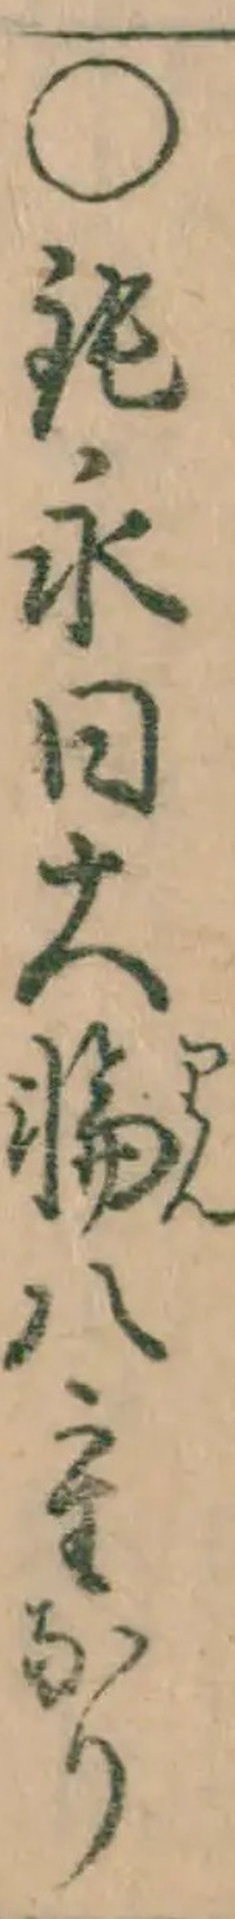○鈍永曰大輪八重なり
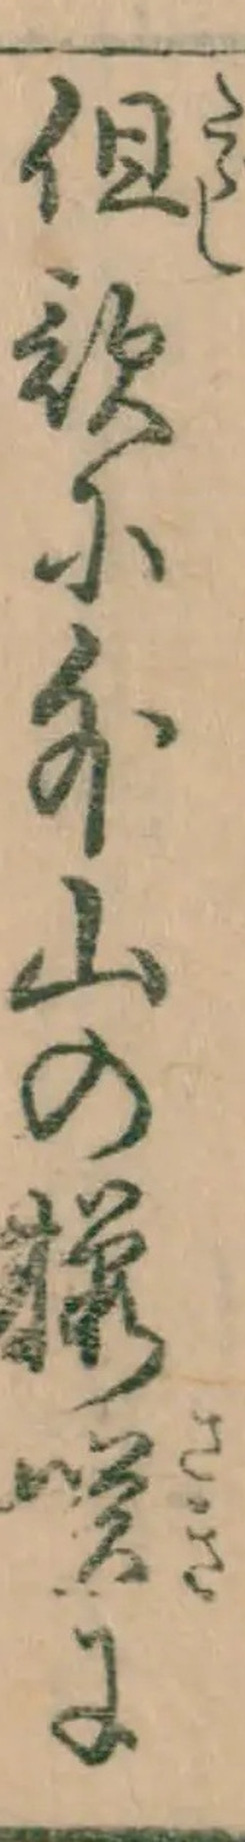但歌に外山の桜咲に
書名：怡顔齋櫻品
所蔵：国立国会図書館 National Diet Library, JAPAN
